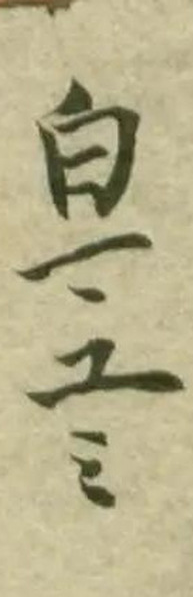白マユミ
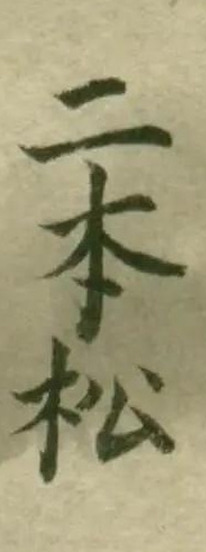二本松
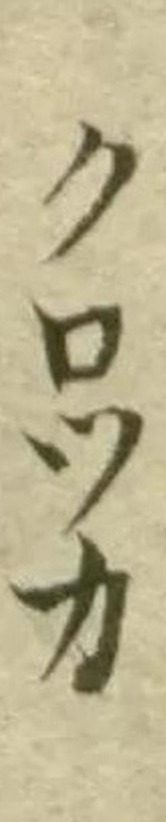クロツカ

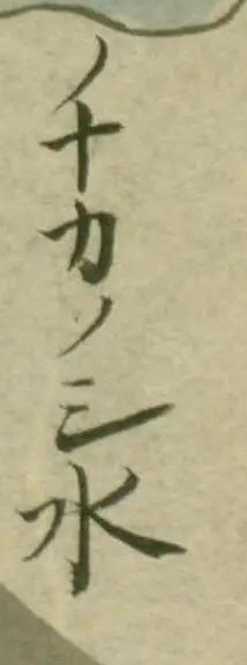チカノシ水
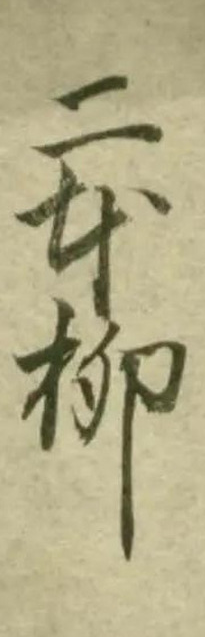二本柳
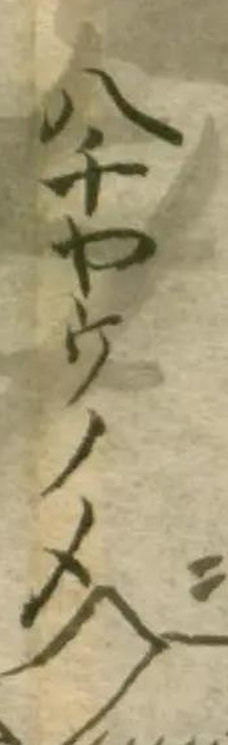八チヤウノメ

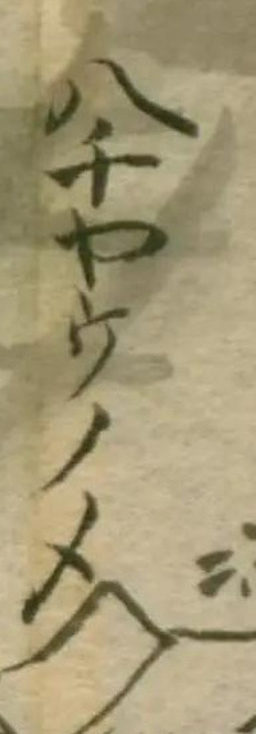八チヤウノメ
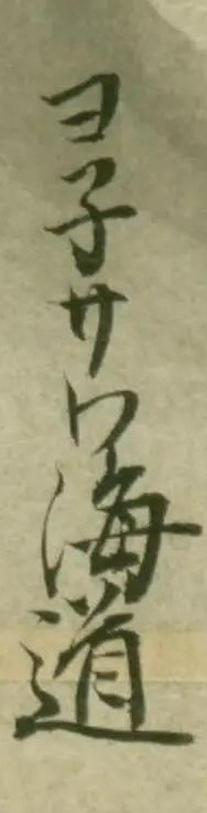ヨネサワ海道
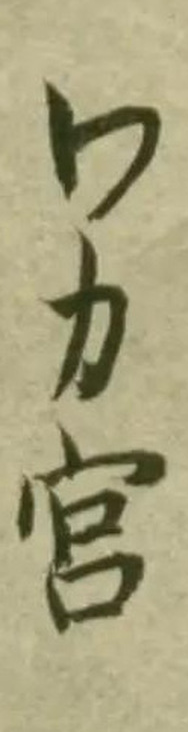ワカ宮
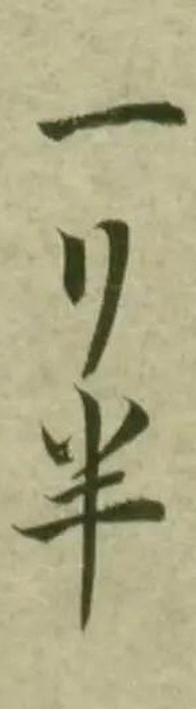一リ半
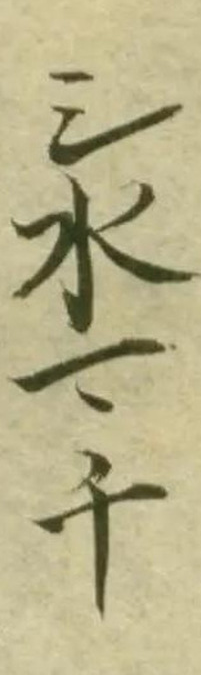シ水マチ
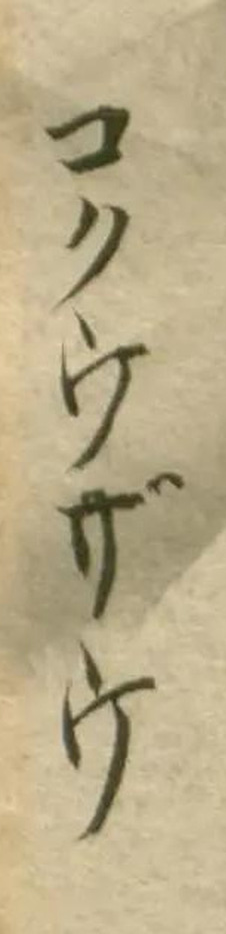コクウザウ

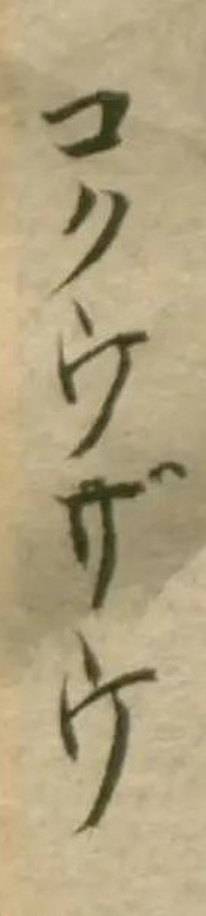コクウザウ
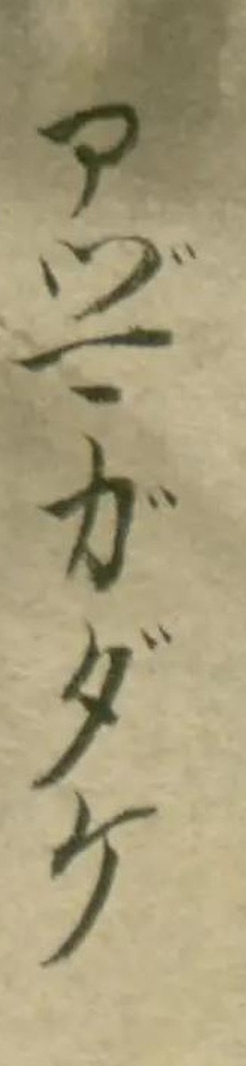アヅマガダケ
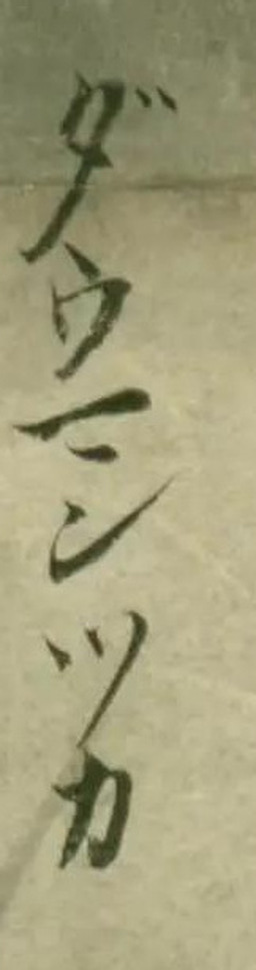ダウマンツカ
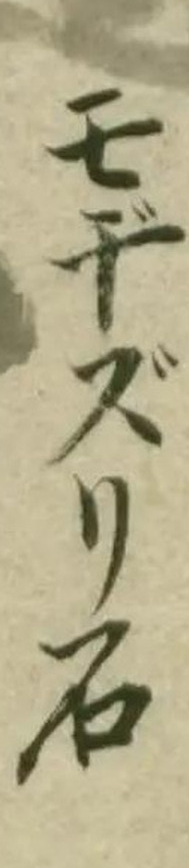モヂズリ石
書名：江戸より奥州津輕迄道筋之圖
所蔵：国立国会図書館 National Diet Library, JAPAN
